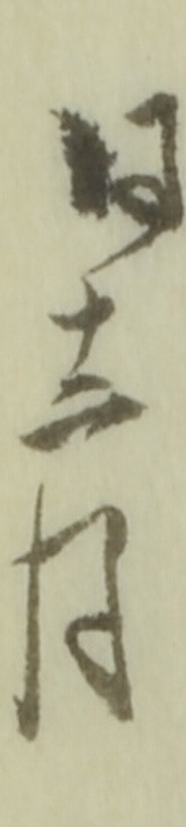同十二月
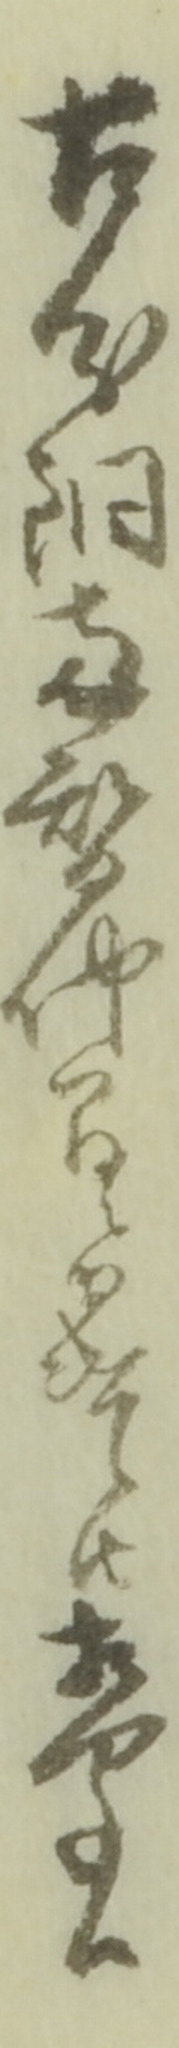右分銅両替仲間二為惑候由相聞候
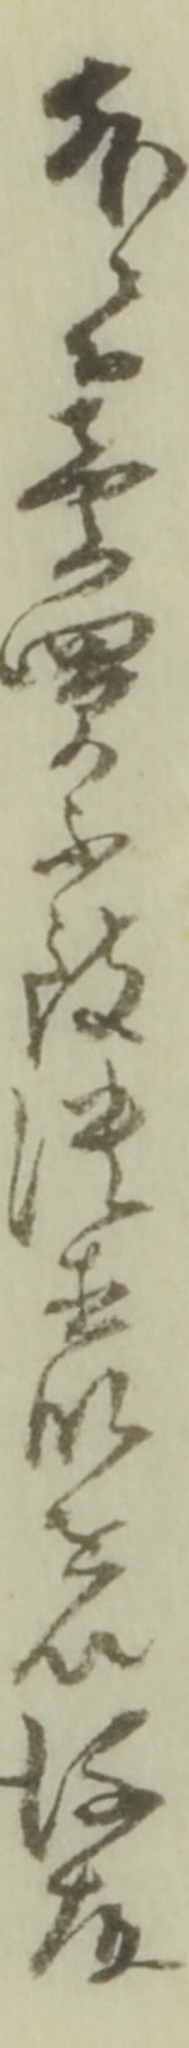外二而売買不致潰値段を以後藤
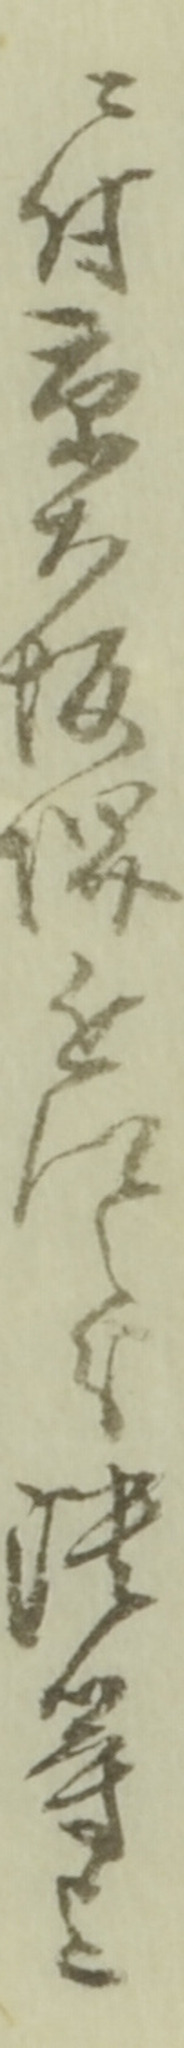二付京大坂堺近辺之義潰等迄
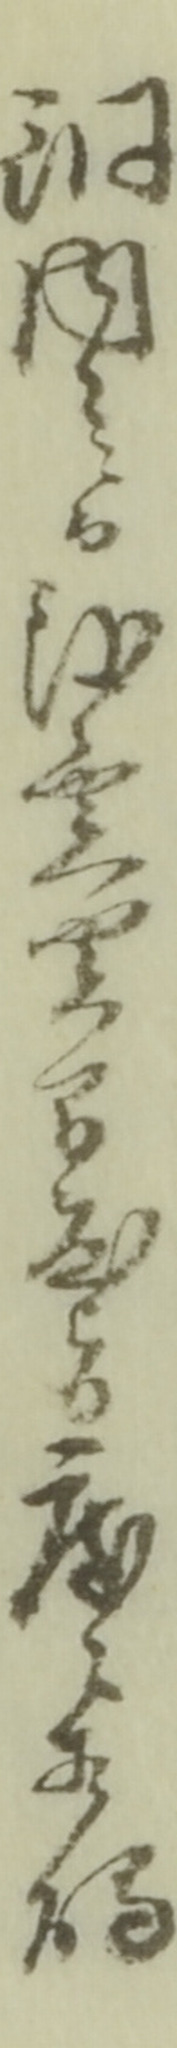銅内々二而致売買間敷旨度々相触
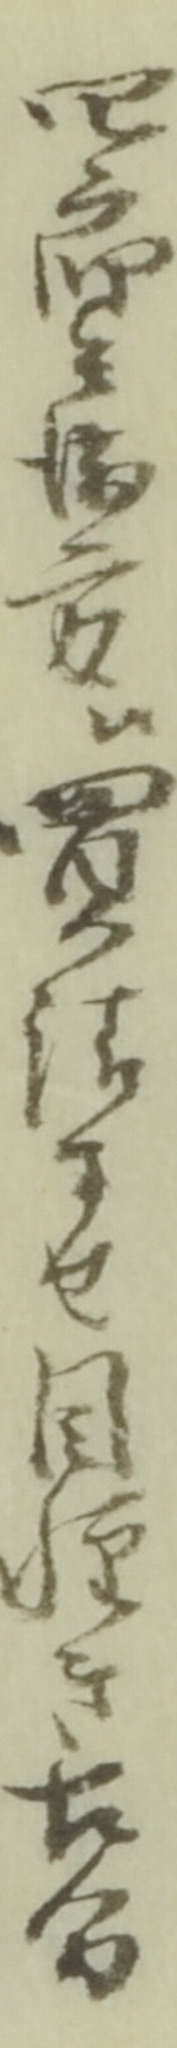四郎兵衛方二買請サセ目軽き古分
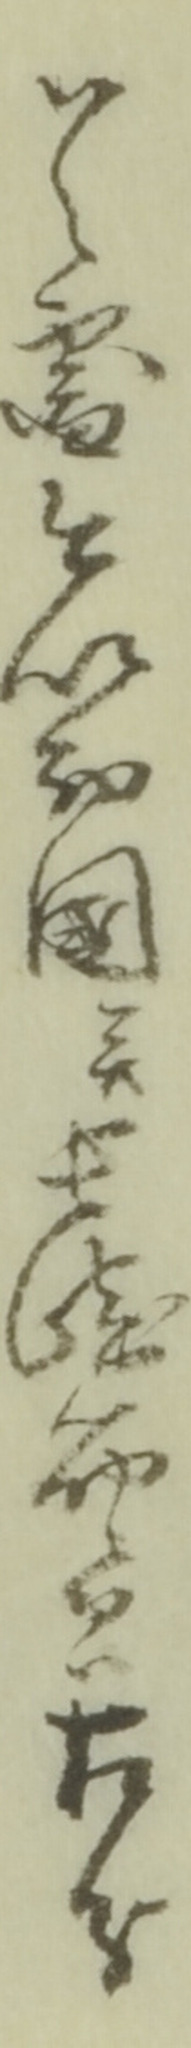候之處今以西国並長崎筋二而ハ古分
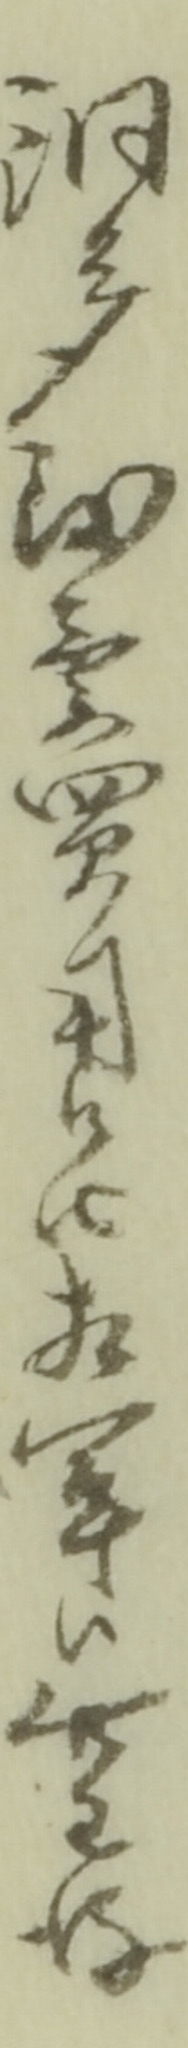銅多致売買用候由相聞候此の後
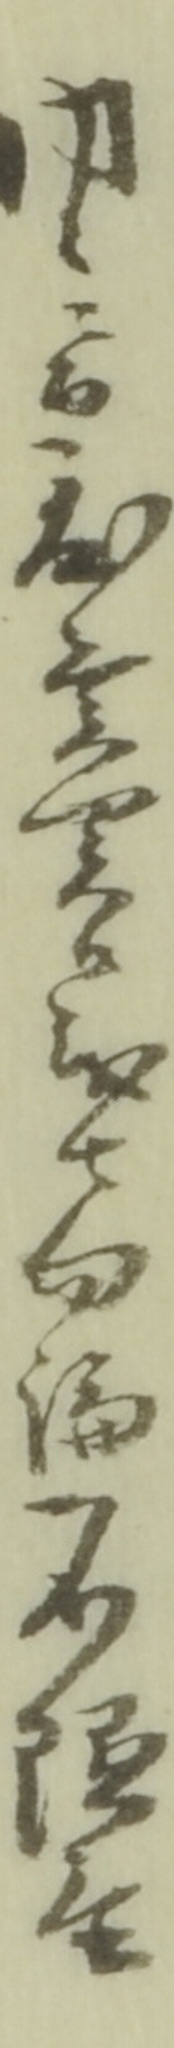内々二而致売買候義者勿論預置
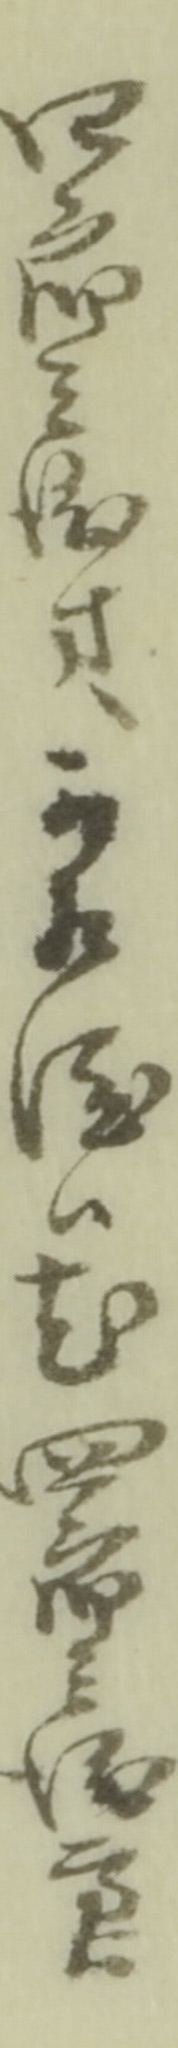四郎兵衛方へ可相渡候尤四郎兵衛方より
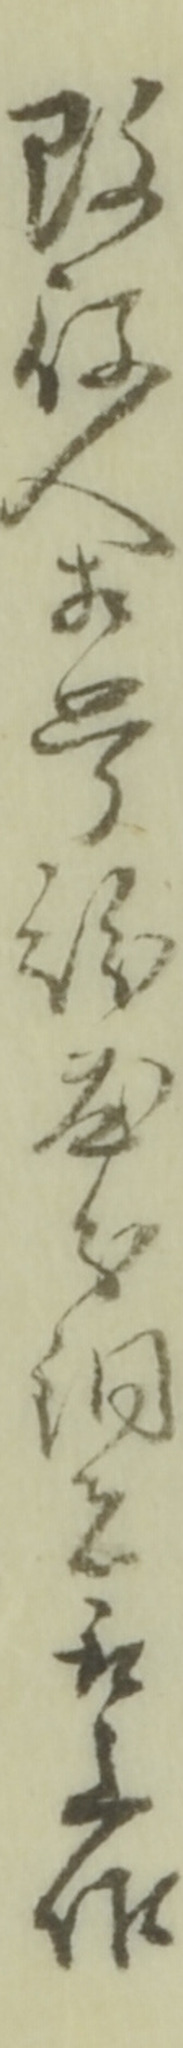改役人相廻紛敷分銅者取上候
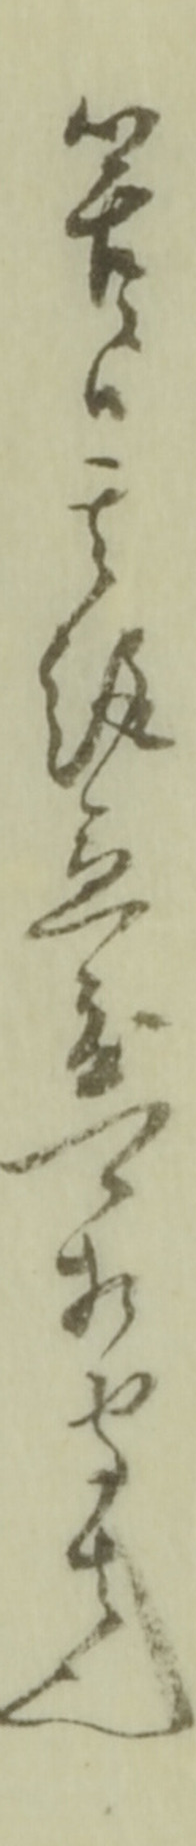筈二候其趣急度可相聞者也
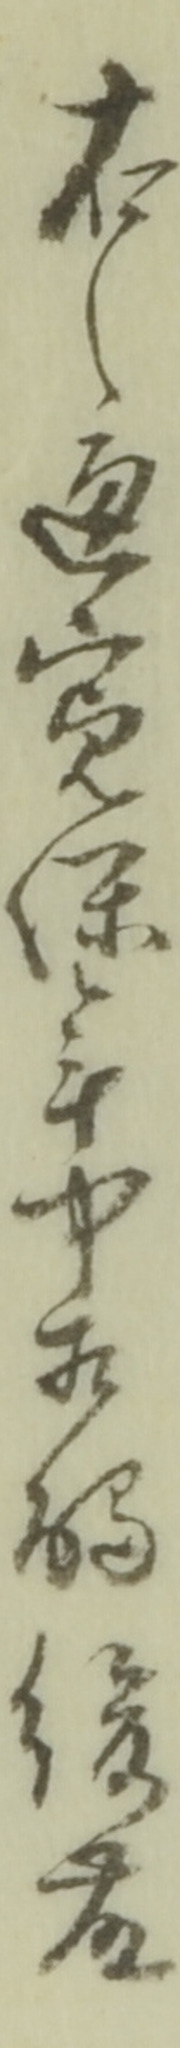右之通寛保年中相触後藤
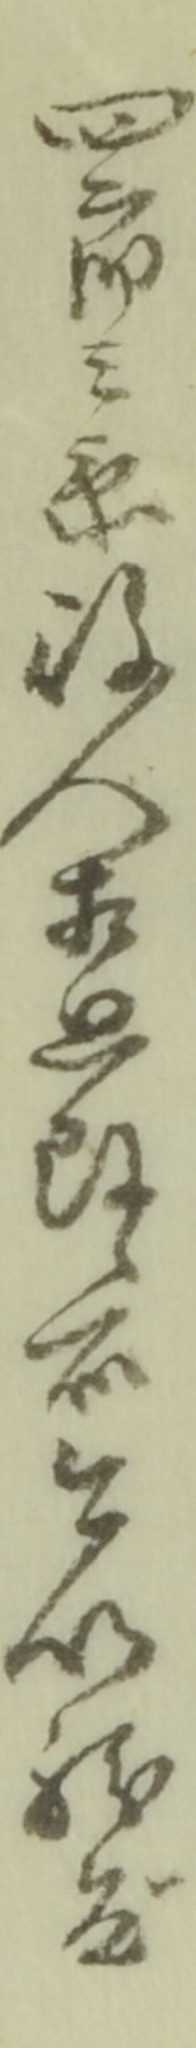四郎兵衛役人相廻改候所今以紛敷
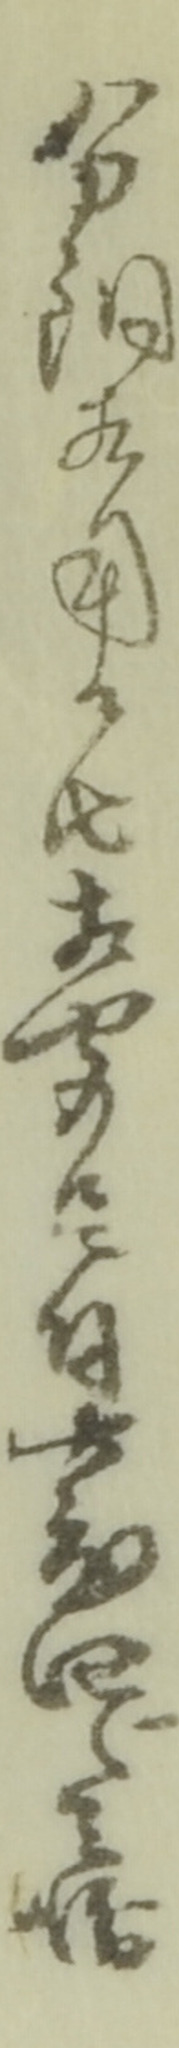分銅相用候由相聞候二付此度四郎兵衛
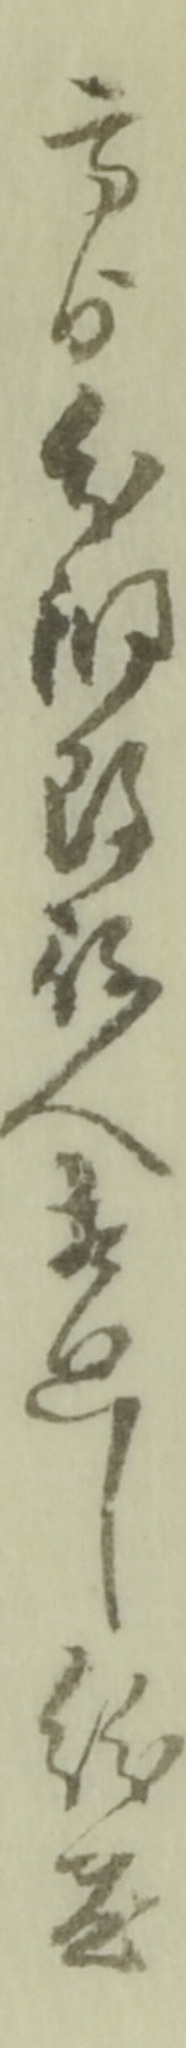方より分銅改役人相廻候紛敷
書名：御公儀様御領主様御触書控
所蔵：伊那市立高遠町図書館・合同会社AMANE
